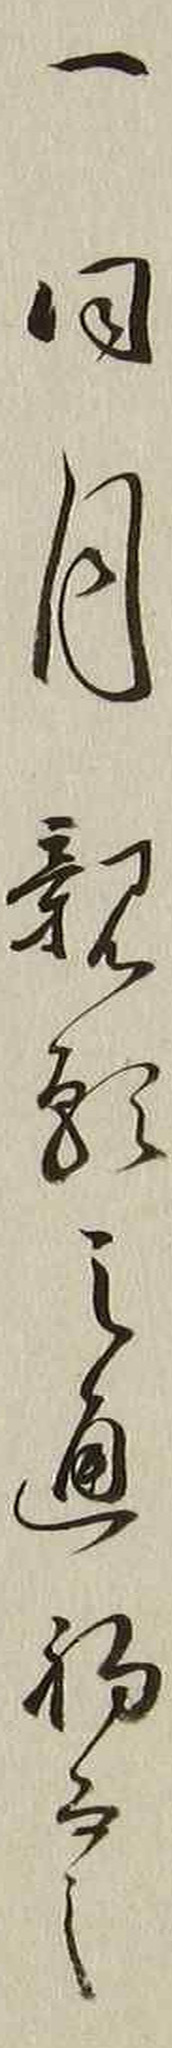一同月親願之通初而之
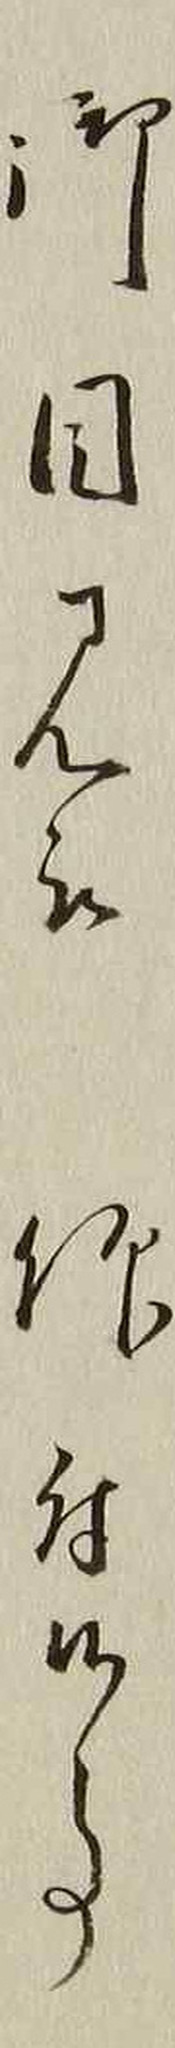御目見被仰付候事
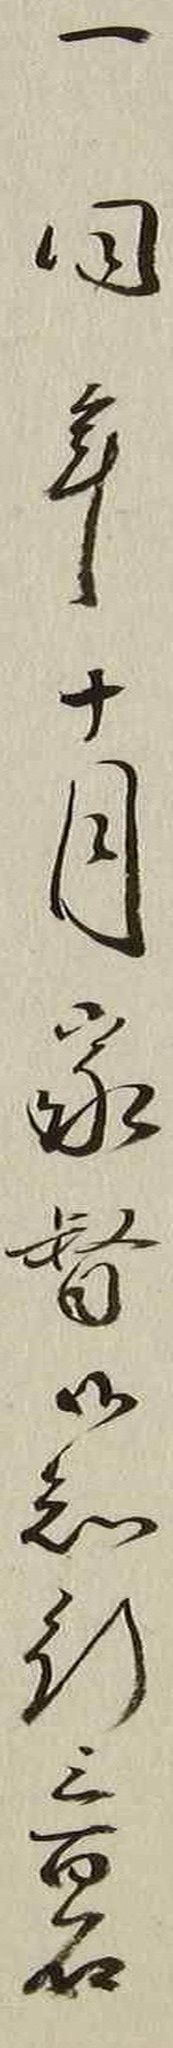一同年十月家督御知行三百石
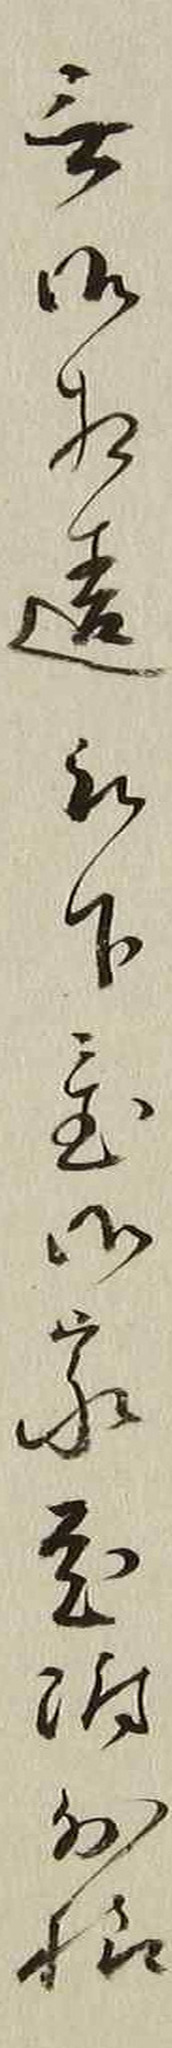無御相違被下置御家老附外様
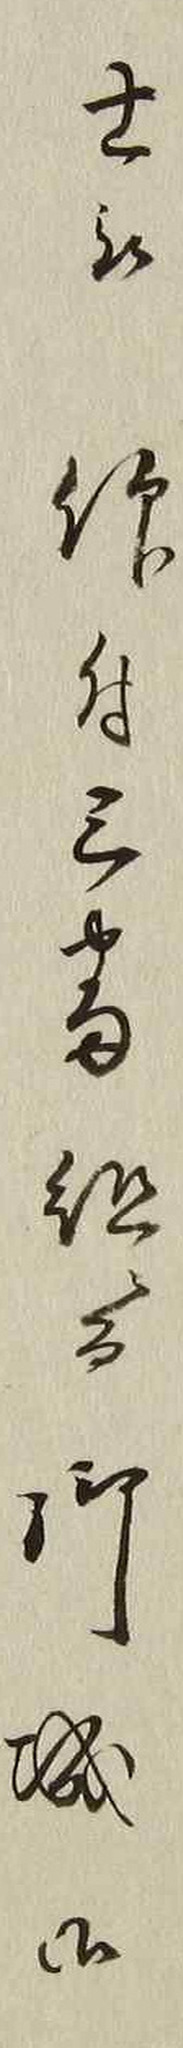士被仰付三番組に而御城御
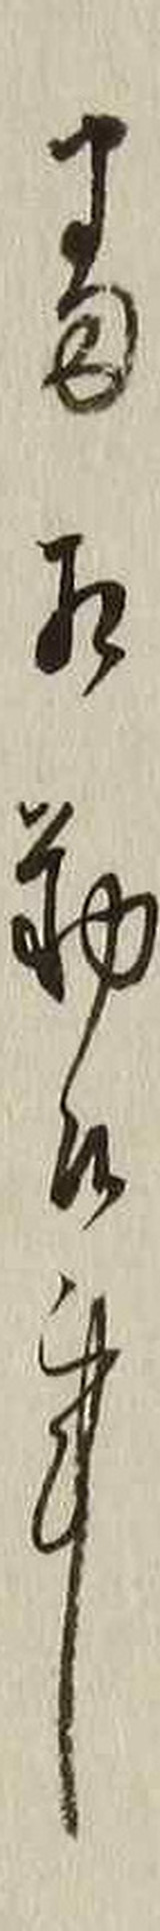番相勤候事
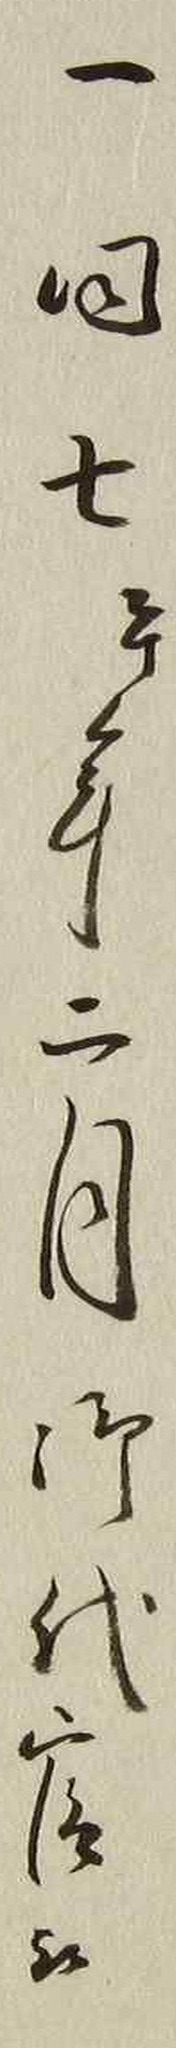一同七午年二月御代官被
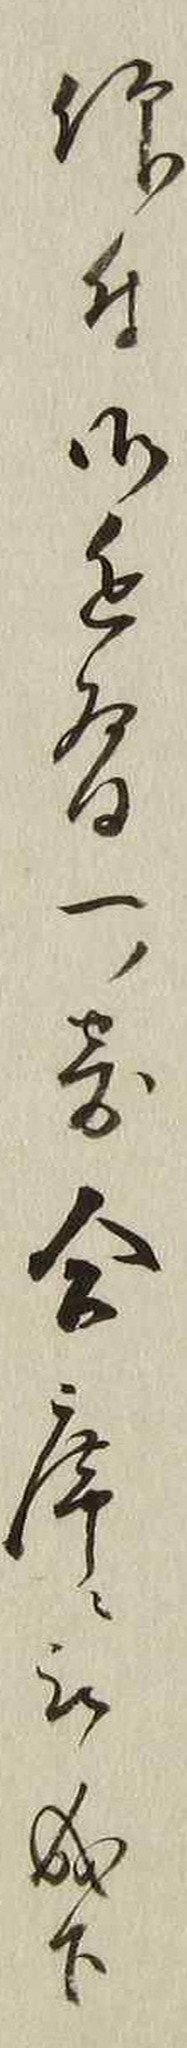仰付御近習一ノ寄合席に被成下
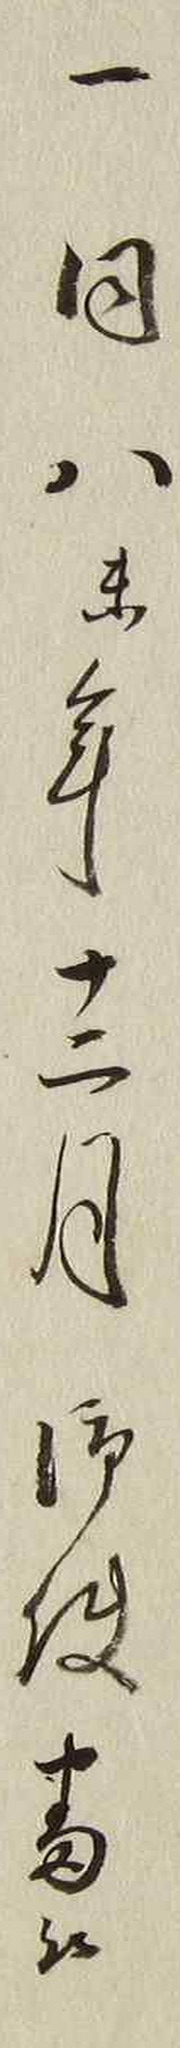一同ハ未年十二月御使番被
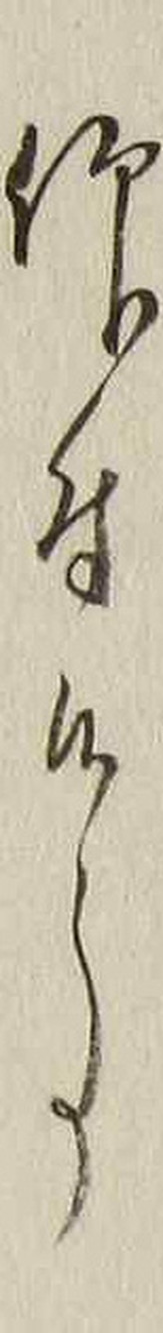仰付候事
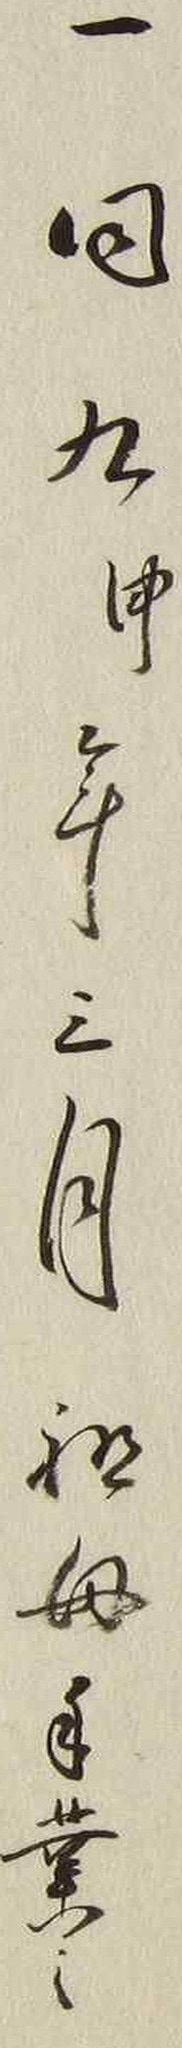一同九申年三月祖母手業之
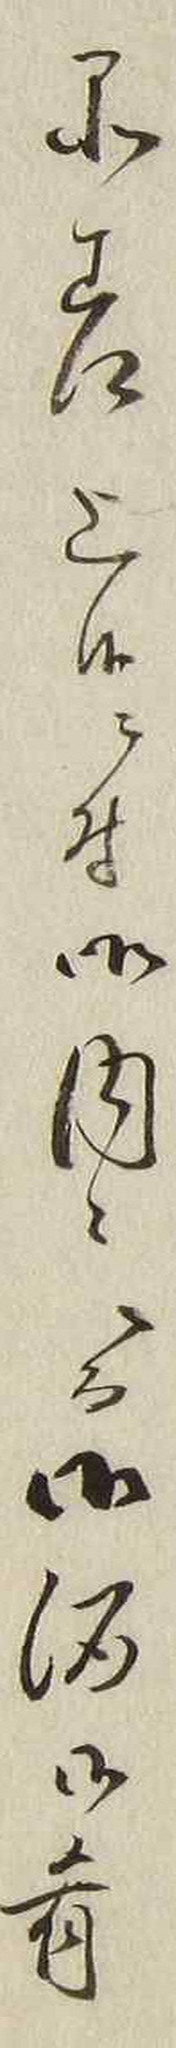品差上候に付御内々に而御酒御肴
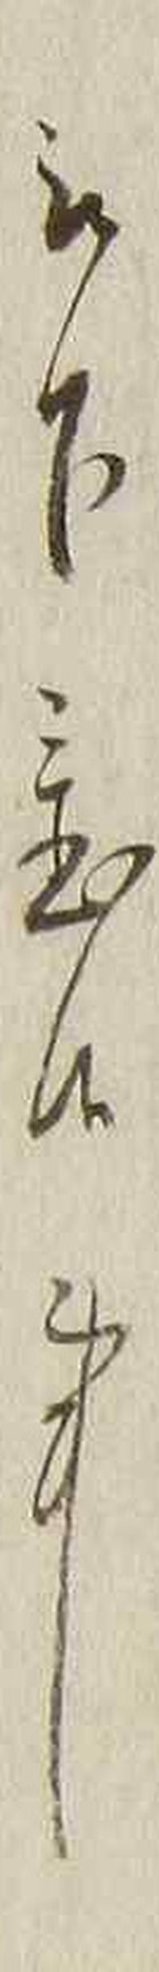被下置候事

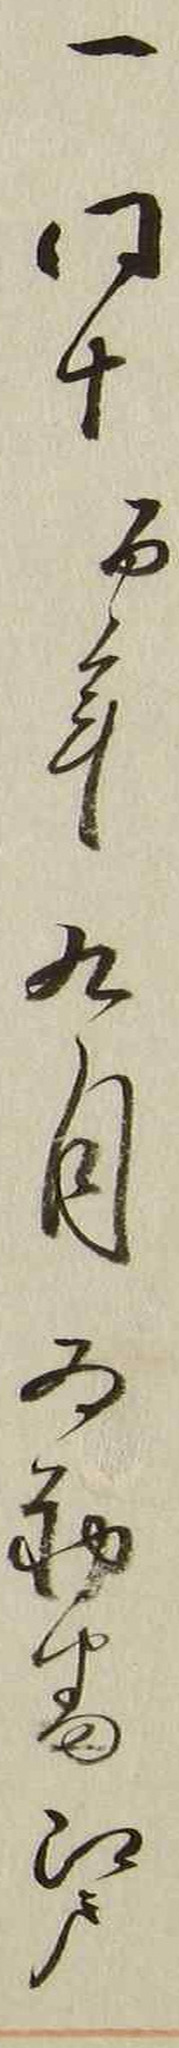一同十酉年九月為勤番江戸
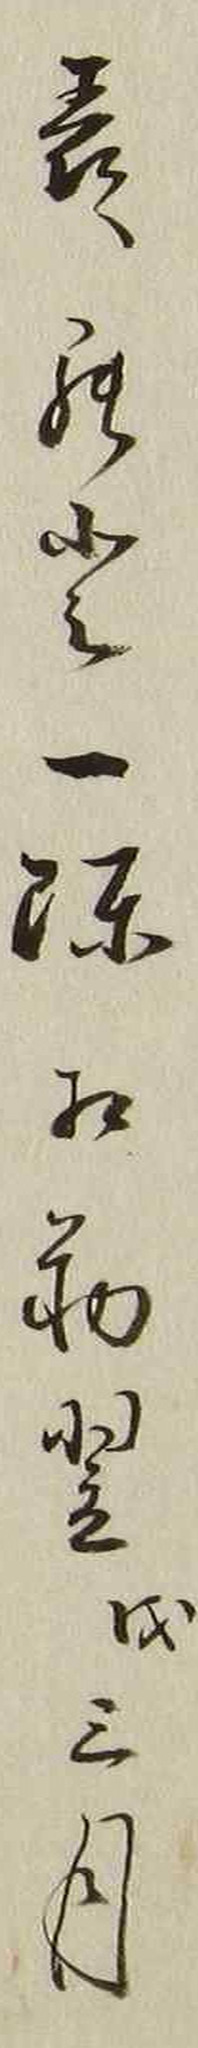表罷登一陣相勤翌戌三月
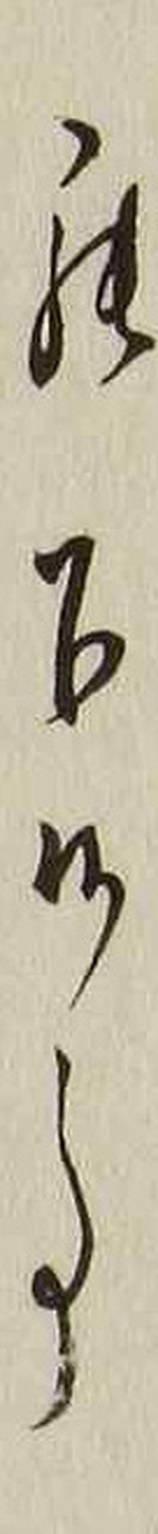罷下候事
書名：諸士系譜　巻之159　な之部1
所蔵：会津若松市立会津図書館
